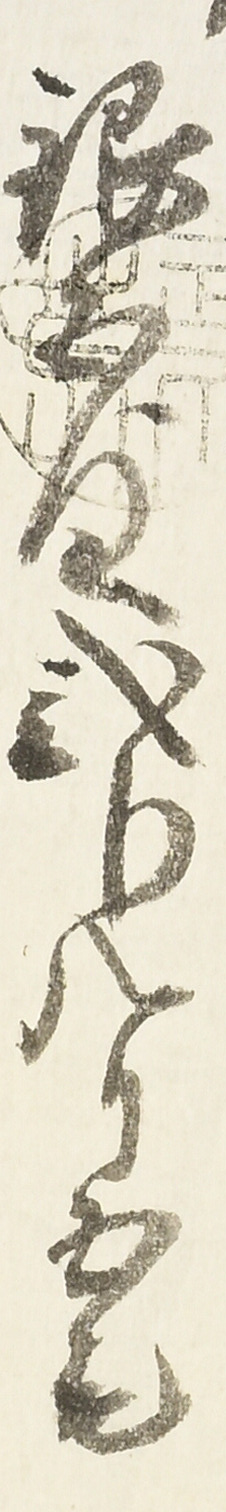銀五匁弐分八厘五毛
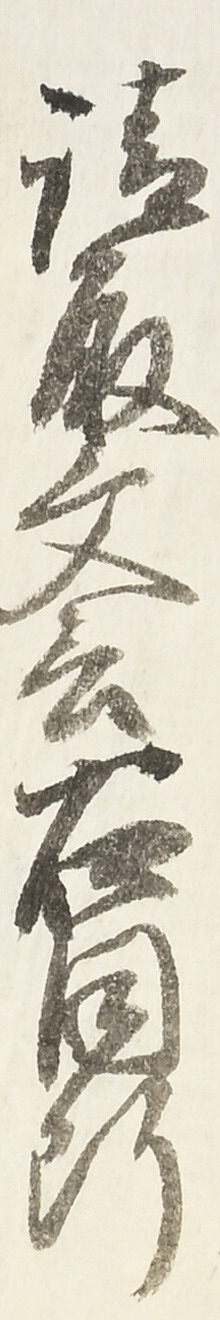請取文言右同断
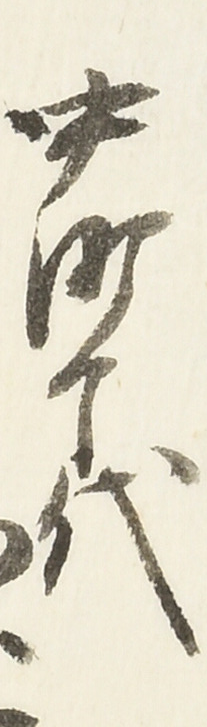中町丁代
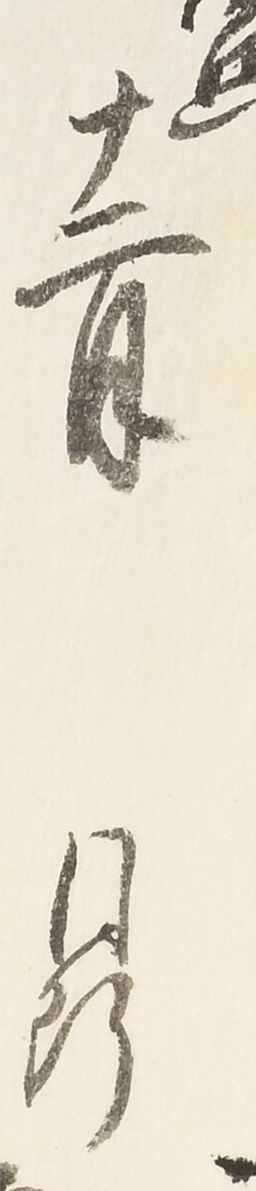十二月同断
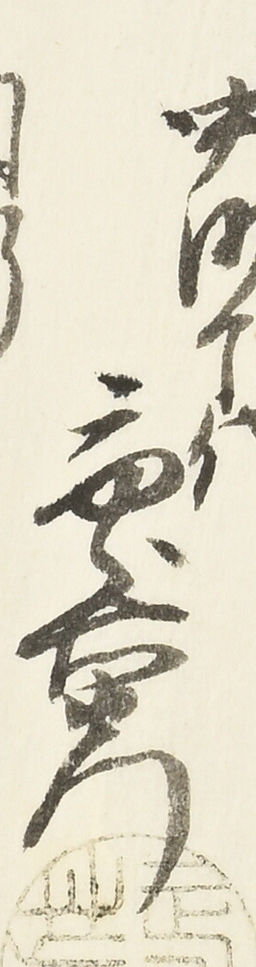忠右衛門
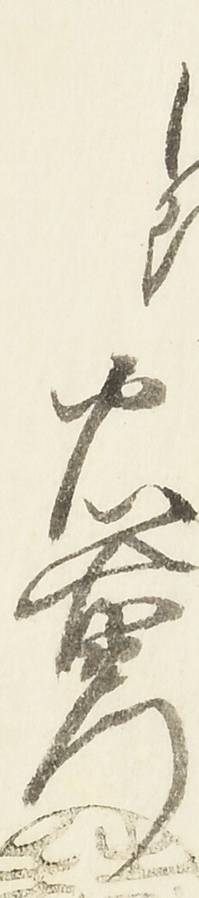忠右衛門
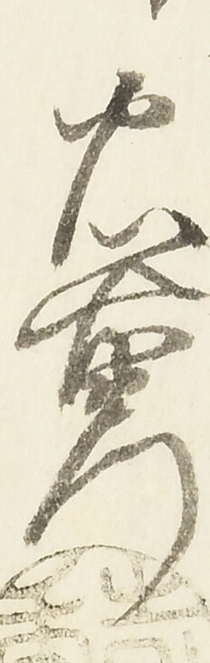忠右衛門
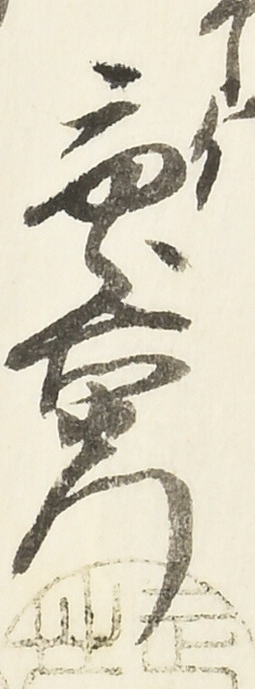忠右衛門
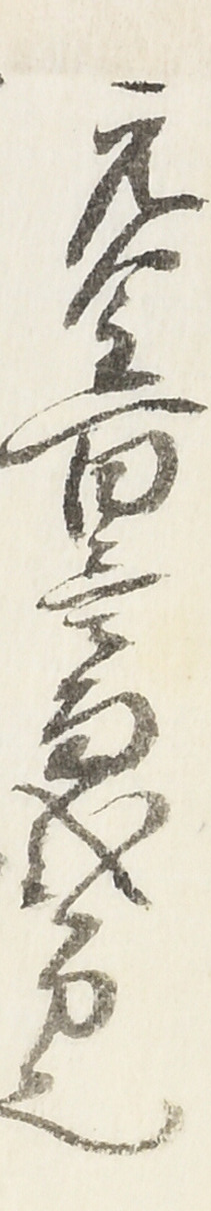元金百壱両弐分也
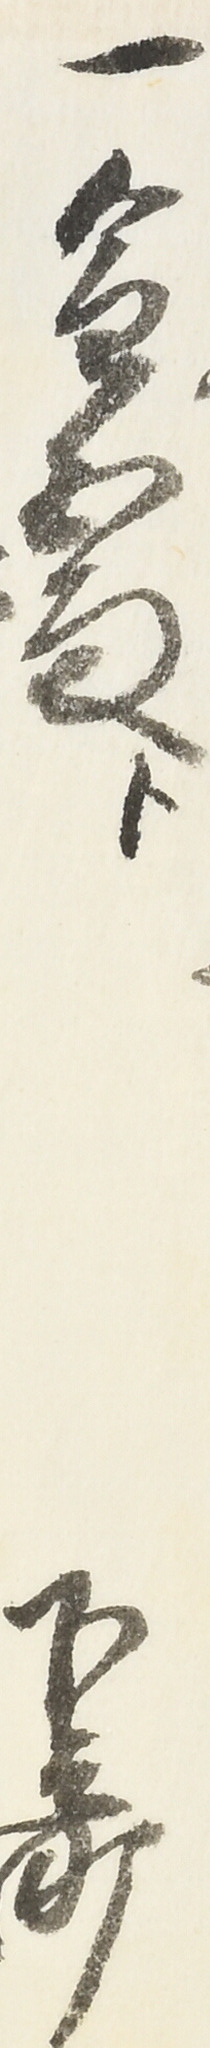一金五両ト下モ町
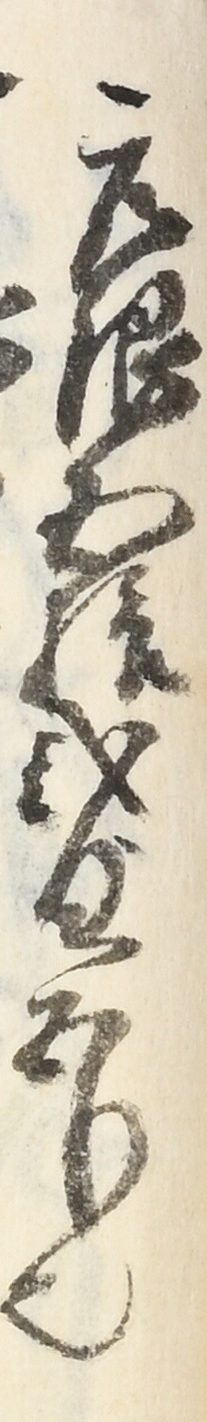元銀三拾壱匁三分也
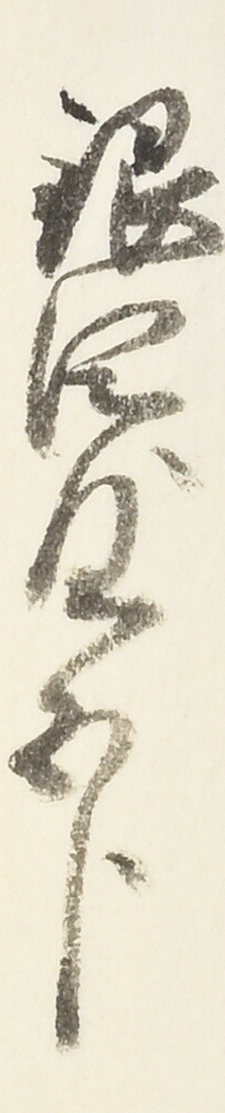銀四匁五分
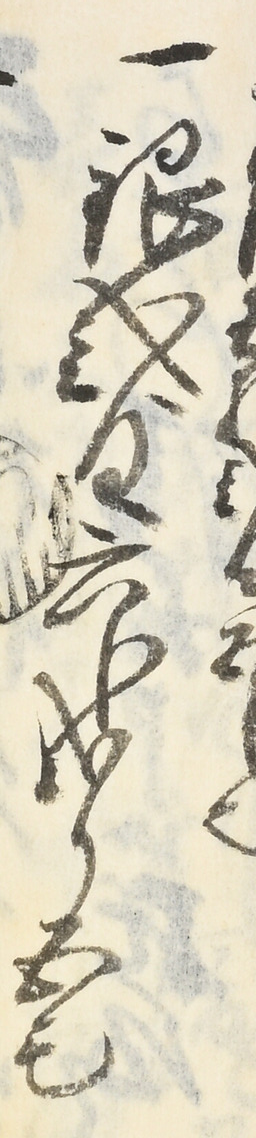一銀壱匁五分六厘五毛
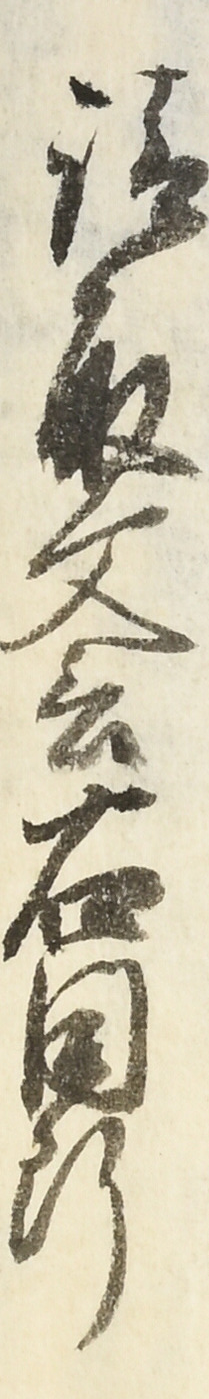請取文言右同断

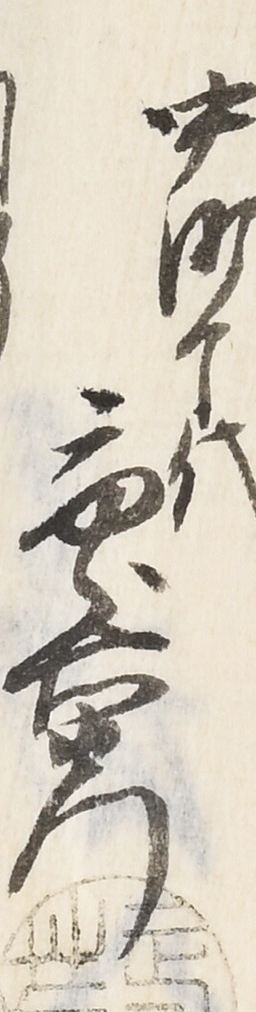寅源右衛門
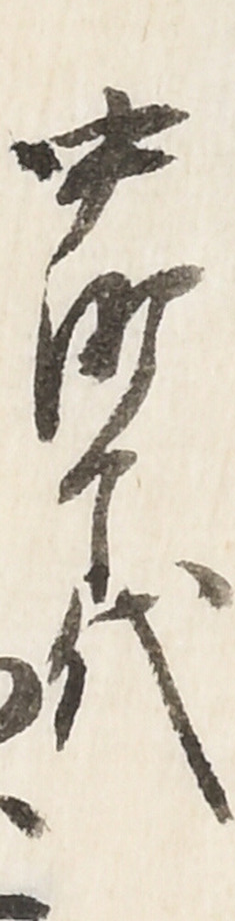新町丁代
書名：御才覚金御利足割渡扣帳
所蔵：伊那市立高遠町図書館・合同会社AMANE
